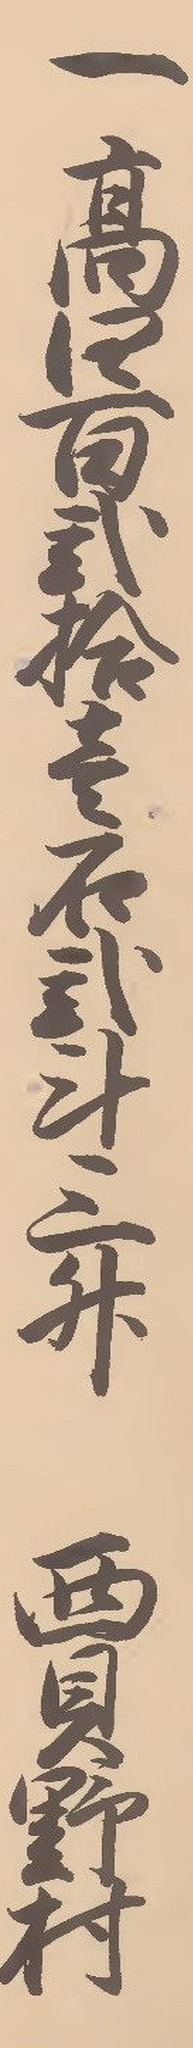一高四百弐拾壱石弐斗三升西貝野村
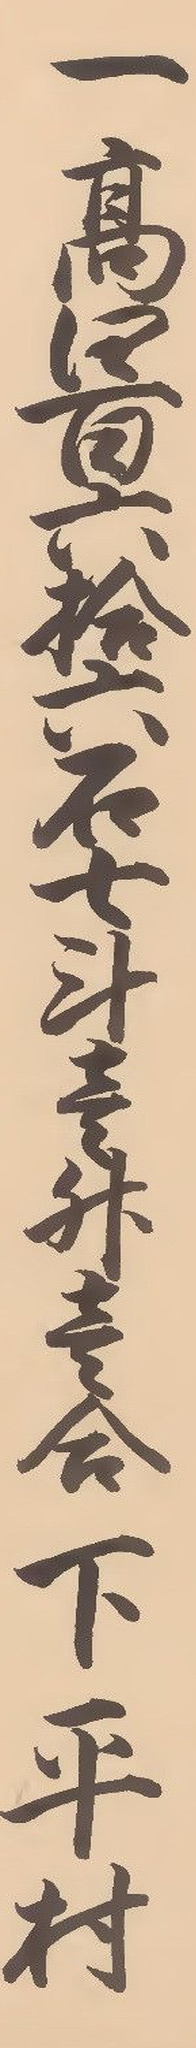一高四百六拾六石七斗壱升壱合下平村
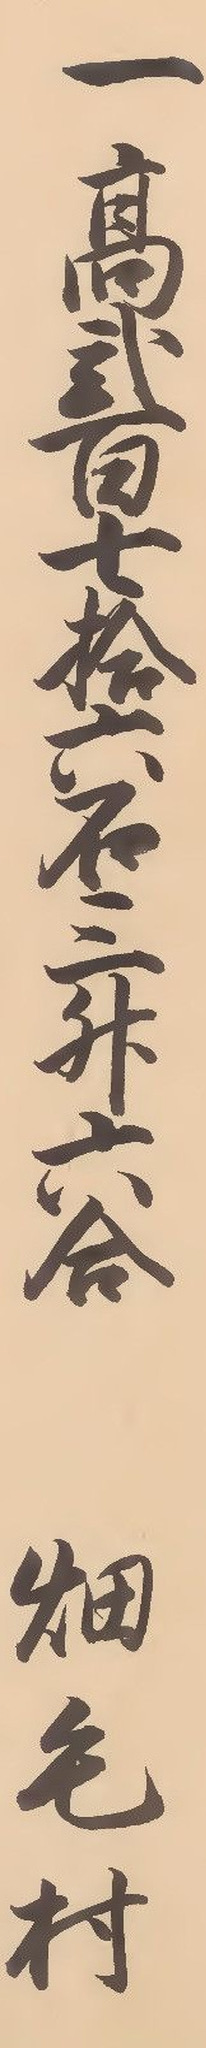一高弐百七拾六石三升六合畑毛村
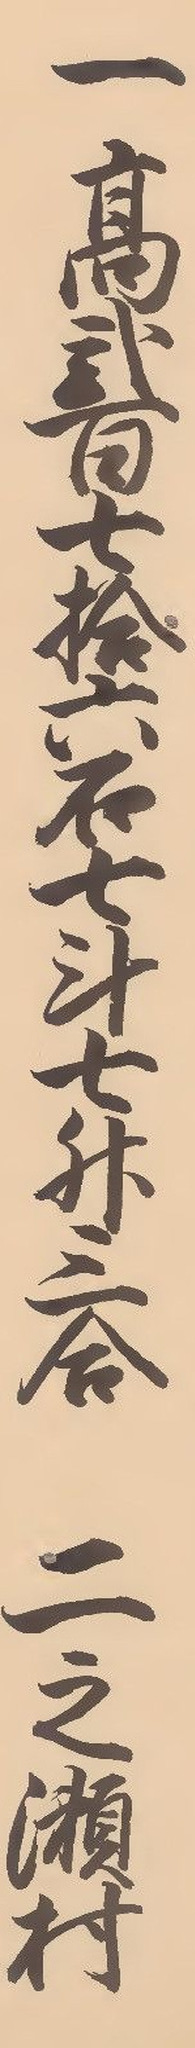一高弐百七拾六石七斗七升三合二之瀬村

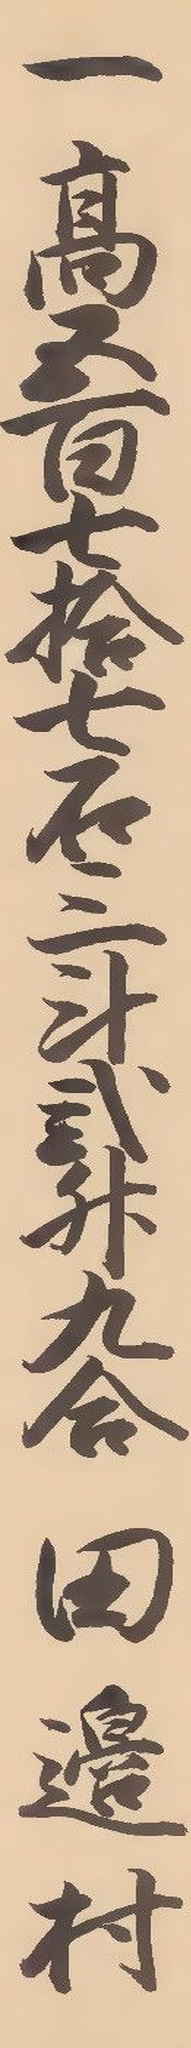一高五百七拾七石三斗弐升九合田辺村
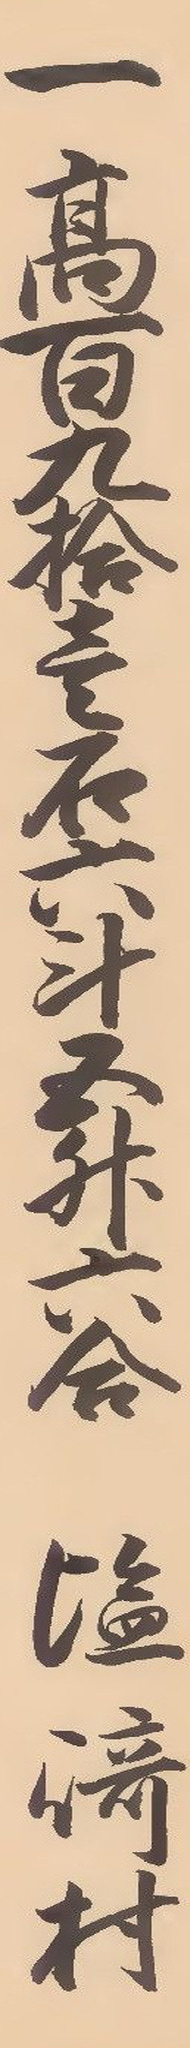一高百九拾壱石六斗五升六合塩崎村
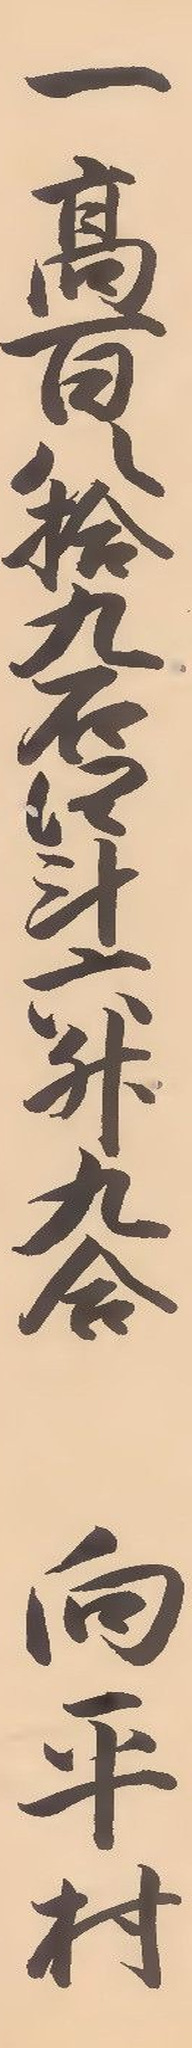一高百八拾九石四斗六升九合向平村
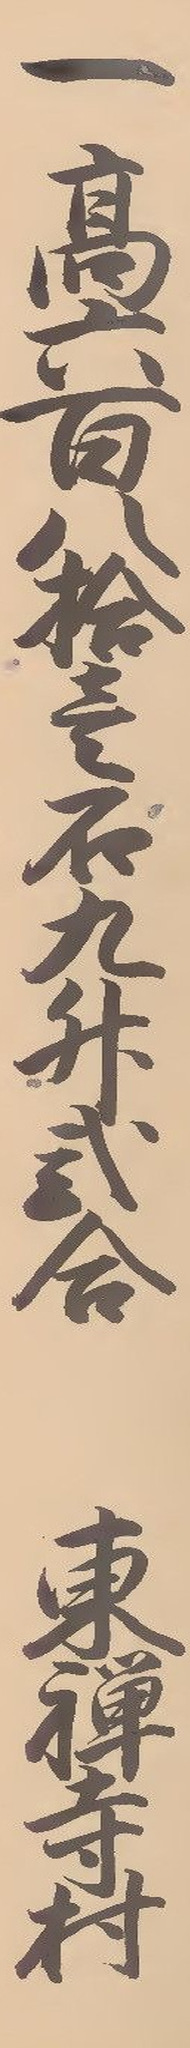一高六百八拾壱石九升弐合東禅寺村
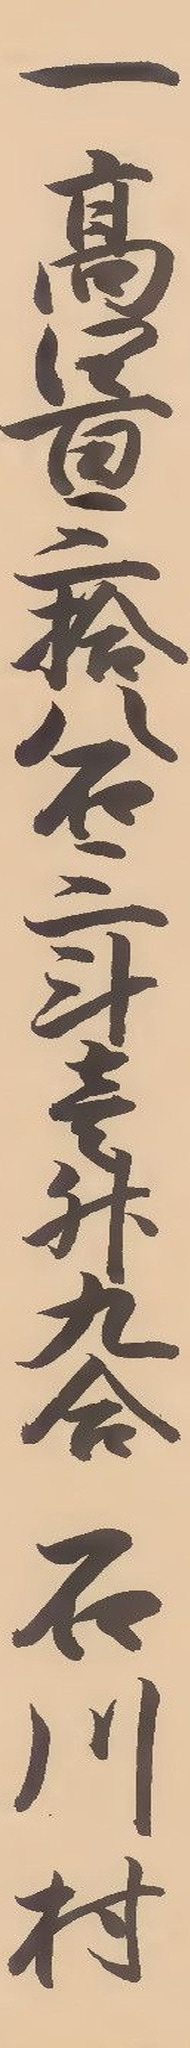一高四百三拾八石三斗壱升九合石川村
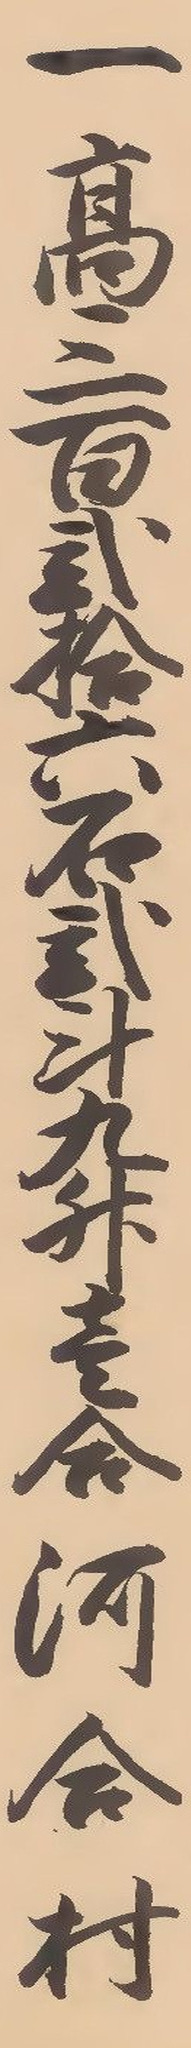一高三百弐拾六石弐斗九升壱合河合村
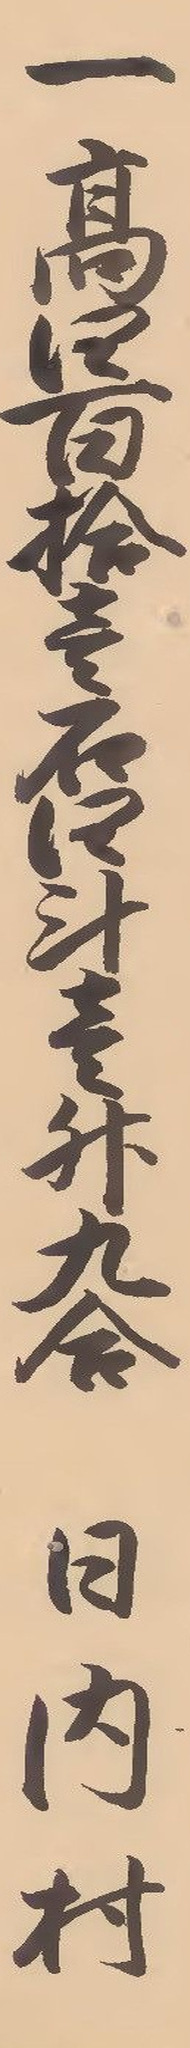一高四百拾壱石四斗壱升九合日内村

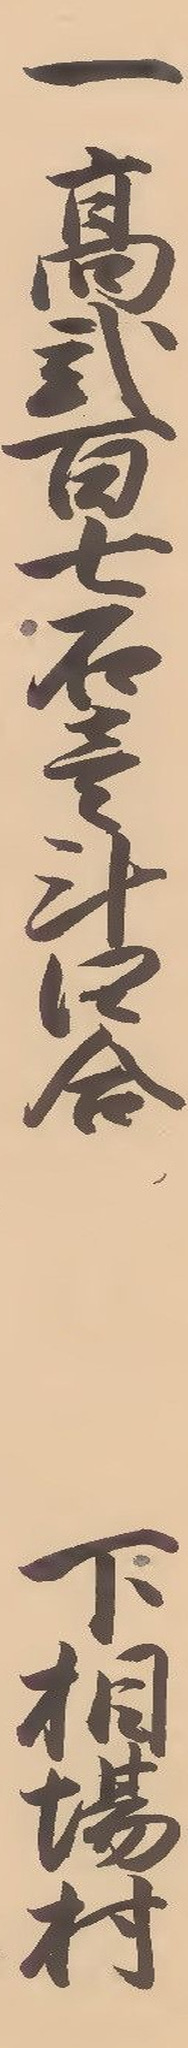一高弐百七石壱斗四合下相場村
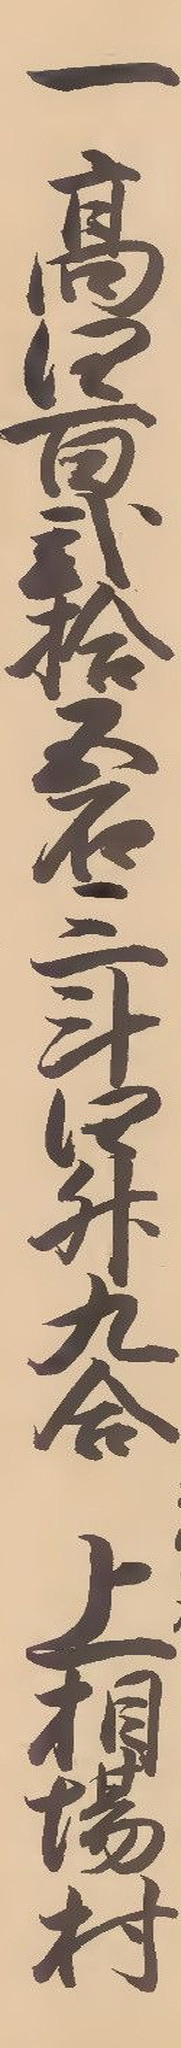一高四百五拾九石三斗壱升四合市場村
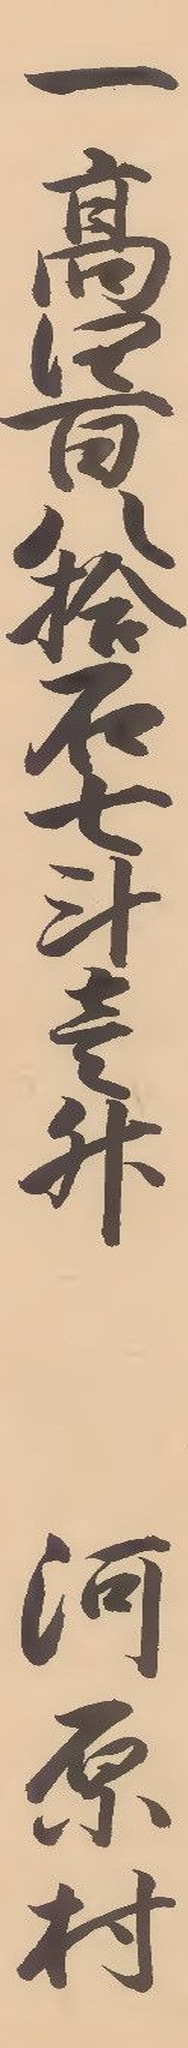一高四百八拾石七斗壱升河原村
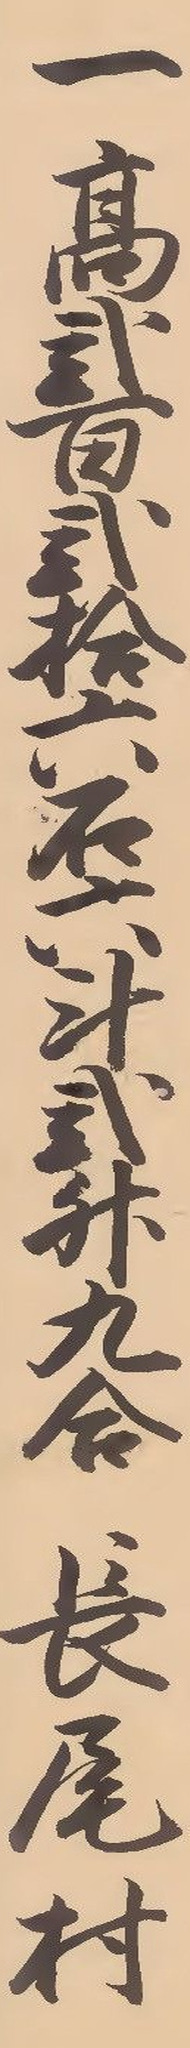一高弐百弐拾六石六斗弐升九合長尾村
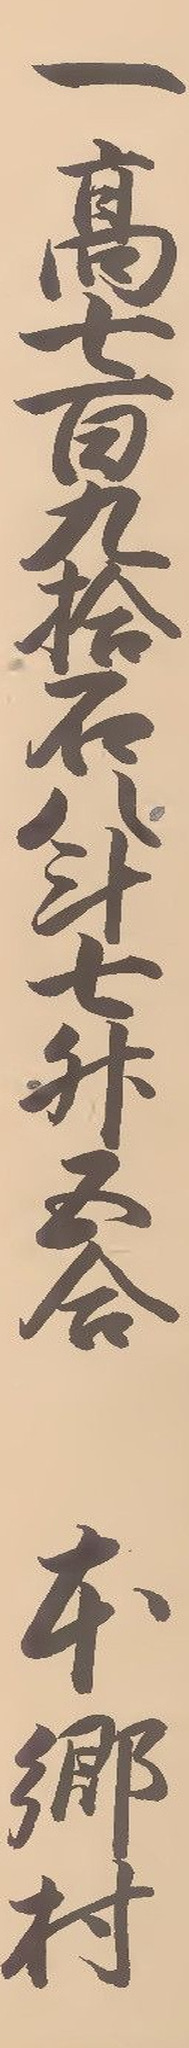一高七百九拾石八斗七升五合本郷村
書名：伊勢国郷帳
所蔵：国立公文書館 National Archives of Japan
